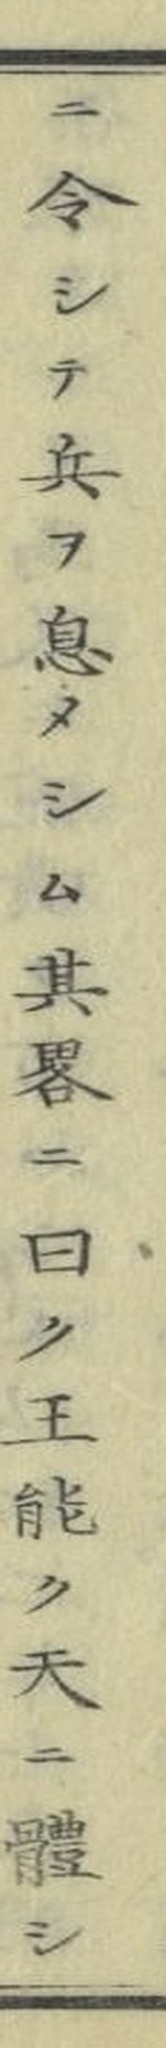ニ令シテ兵ヲ息メシム其畧ニ曰ク王能ク天ニ體シ
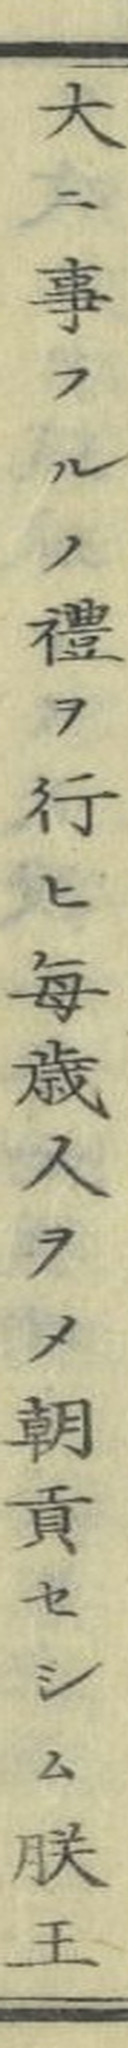大ニ事フルノ禮ヲ行ヒ毎歳人ヲシテ朝貢セシム朕王
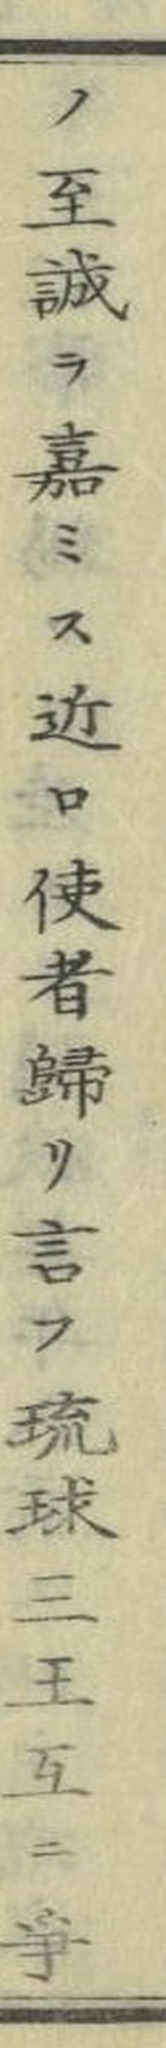ノ至誠ヲ嘉ミス近々使者歸リ言フ琉球三王互ニ爭
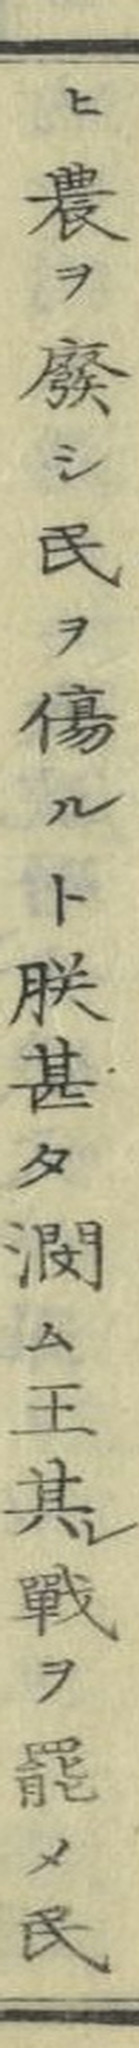ヒ農ヲ廢シ民ヲ傷ルト朕甚タ潣ム王其戰ヲ罷メ民
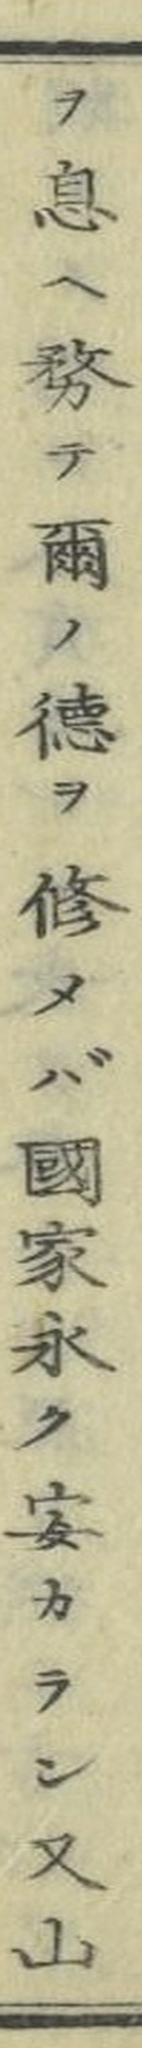ヲ息ヘ務テ爾ノ德ヲ修メバ國家永ク安カラン又山
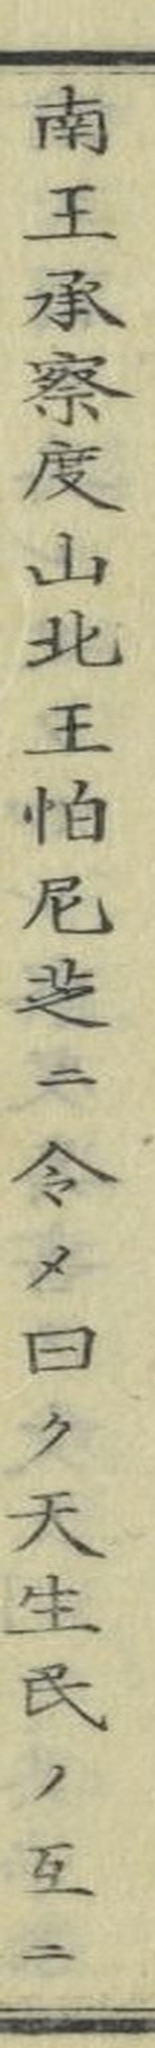南王承察度山北王怕尼芝ニ令シテ曰ク天生民ノ互ニ
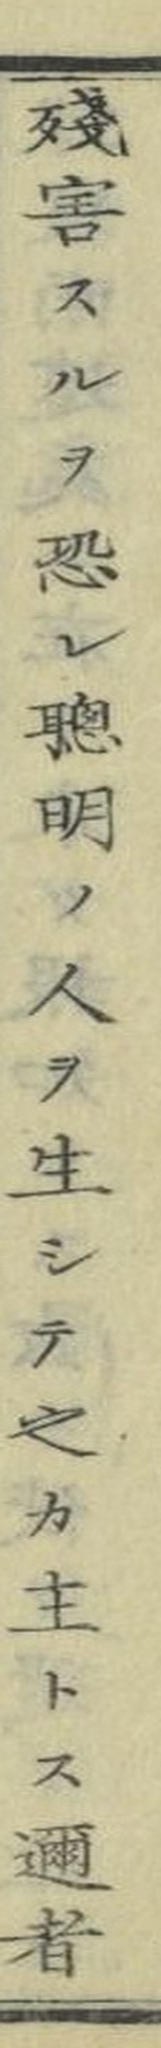殘害スルヲ恐レ聰明ノ人ヲ生シテ之カ主トス邇者
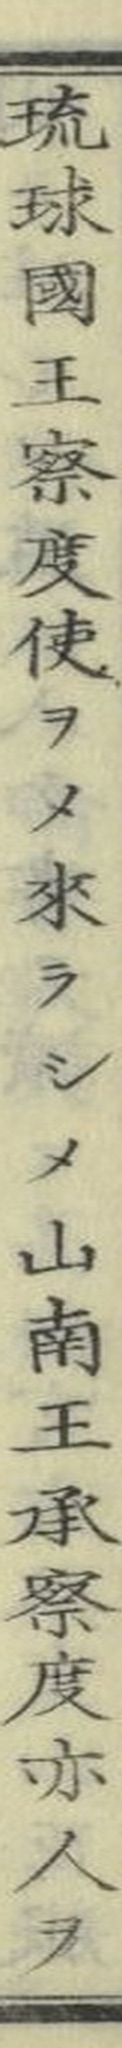琉球國王察度使ヲシテ來ラシメ山南王承察度亦人ヲ
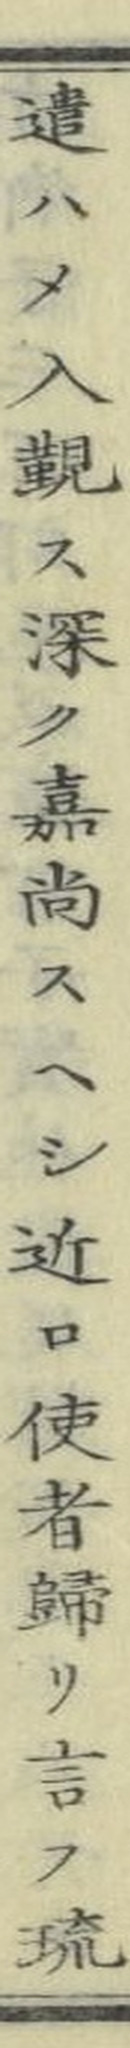遣ハシメ入覲ス深ク嘉尚スヘシ近々使者歸リ言フ流
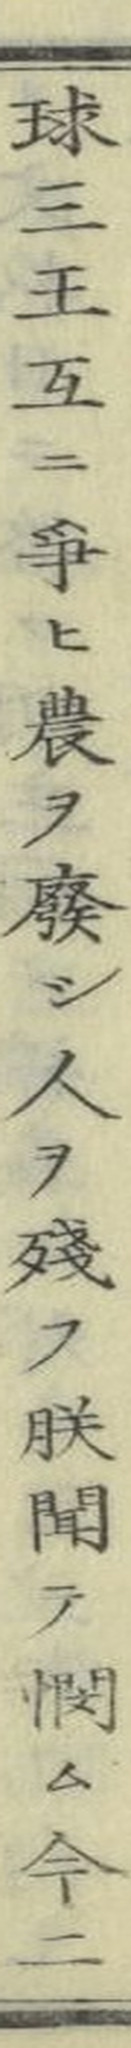球三王互ニ爭ヒ農ヲ廢シ人ヲ殘フ朕聞テ潣ム今二
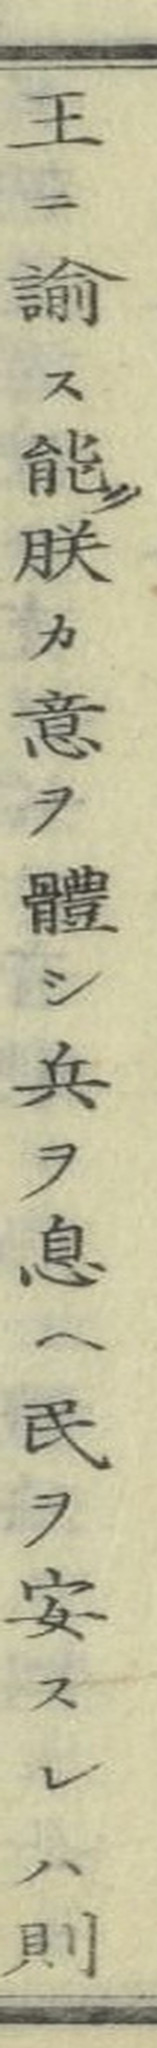王ニ論ス能ク朕カ意ヲ體シ兵ヲ息ヘ民ヲ安スレハ則
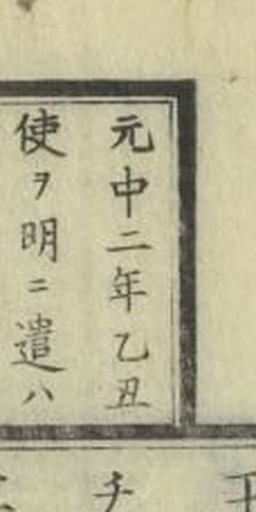元中二年乙丑
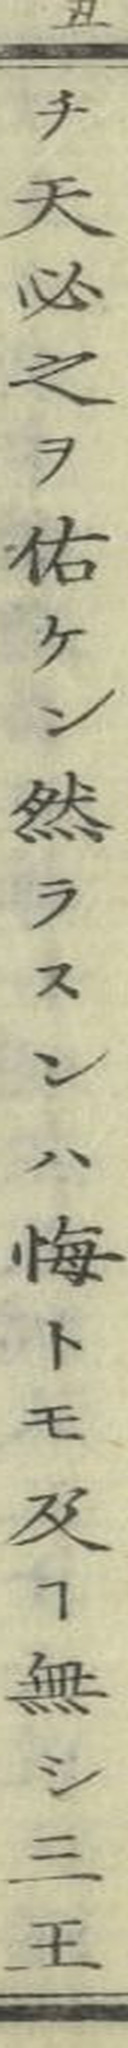チ天必之ヲ佑ケン然ラスンハ悔トモ及コト無シ三王
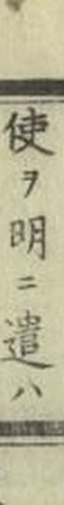使ヲ明に遣ハ
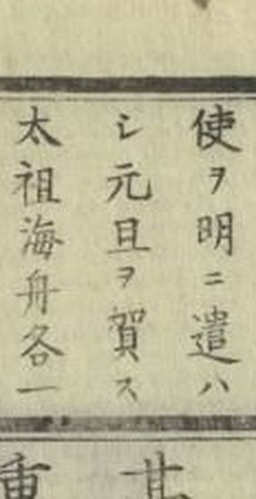シ元旦ヲ賀ス
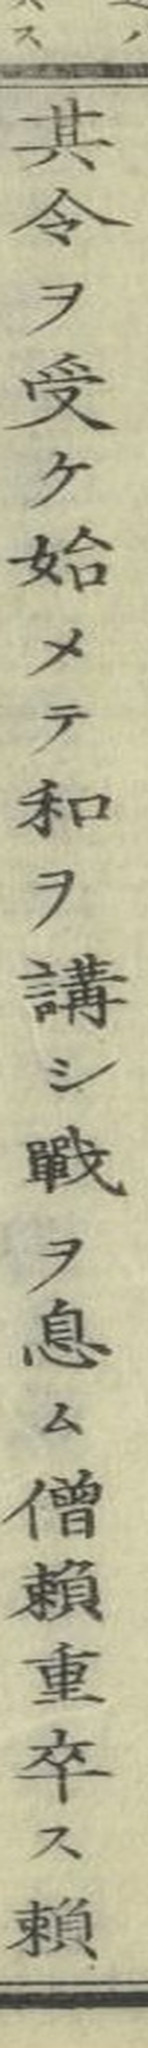其令ヲ受ケ始メテ和ヲ講シ戰ヲ息ム僧頼重卒ス賴
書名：琉球藩史 一之巻
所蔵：University of the Ryukyus Library
